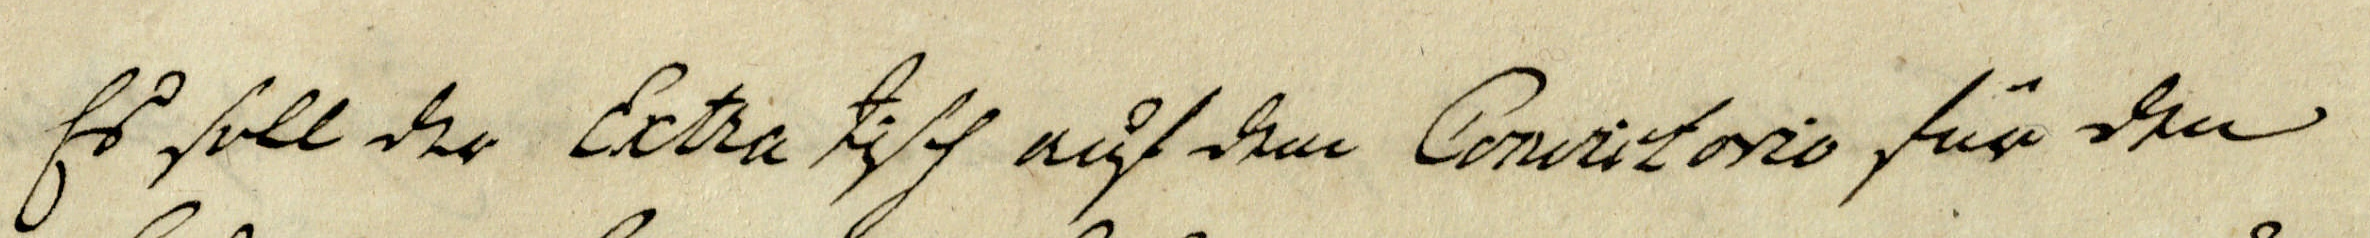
Es soll der Extra Tisch auf dem Convictorio für den
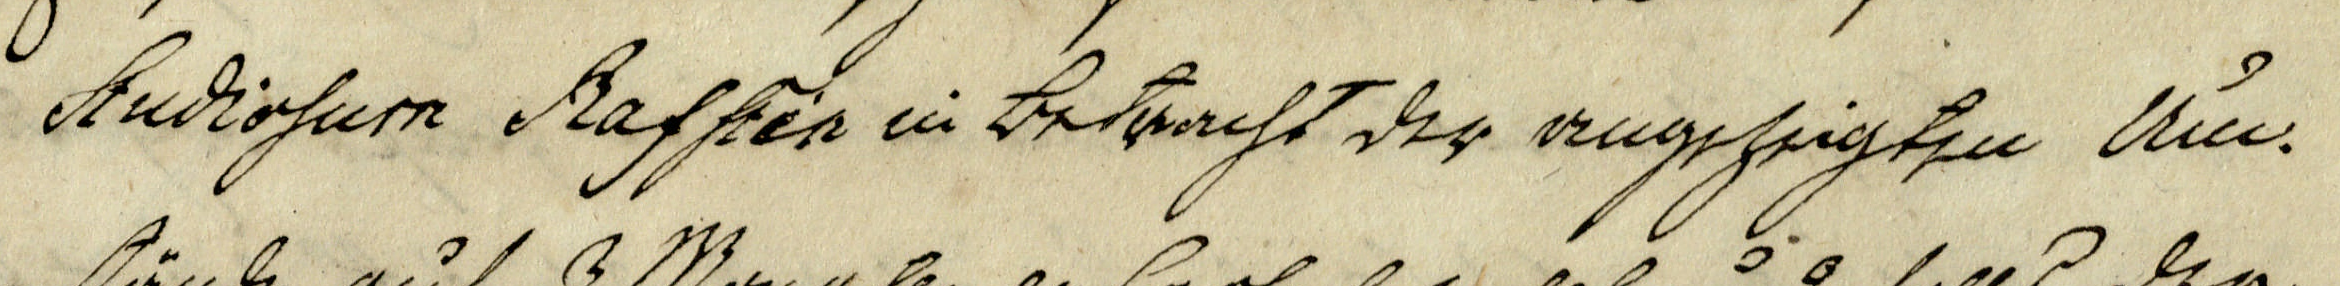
Studiosum Rafsten in Betracht der angezeigten Um¬
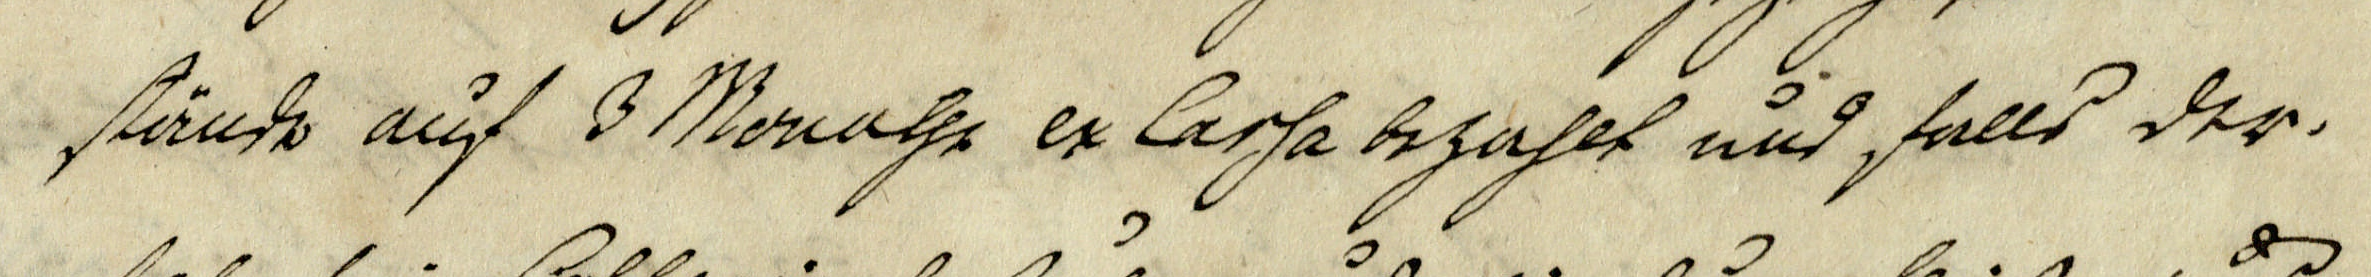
stände auf 3 Monathe ex Cassa bezahlt und falls der¬
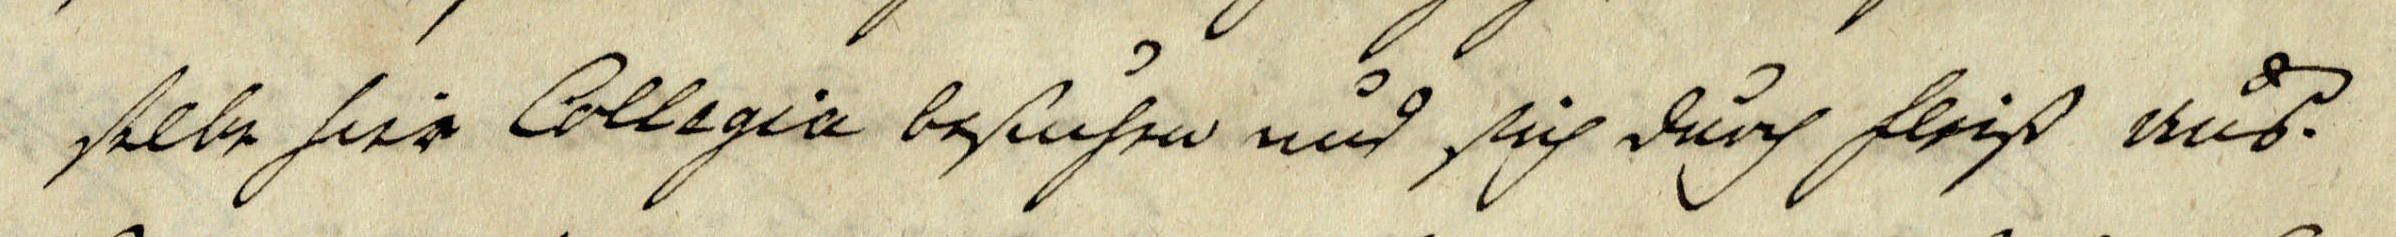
selbe hier Collegia besuchen und sich durch Fleiß aus¬
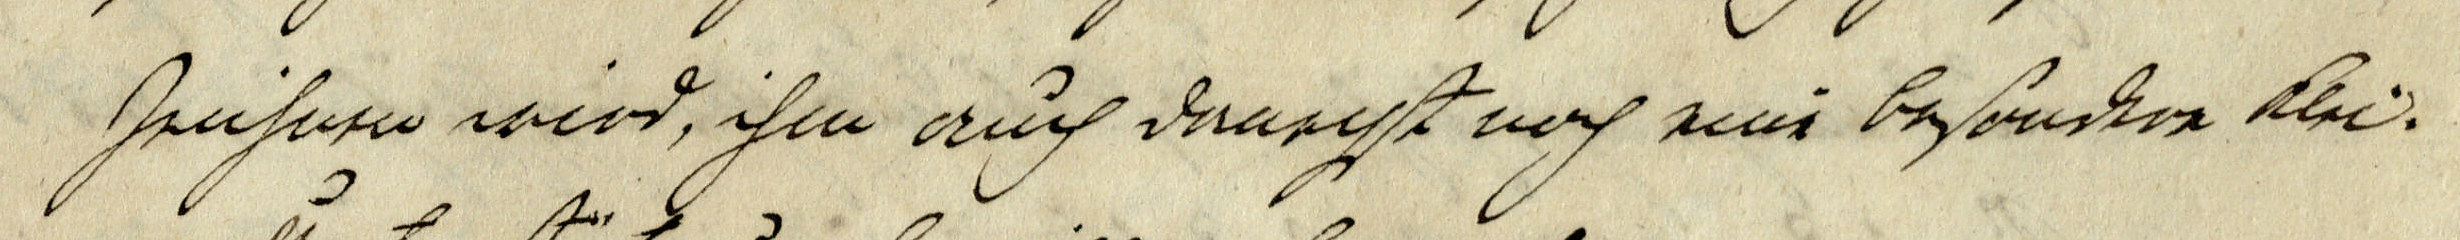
zeichnen wird, ihm auch danechst noch eine besondere klei¬
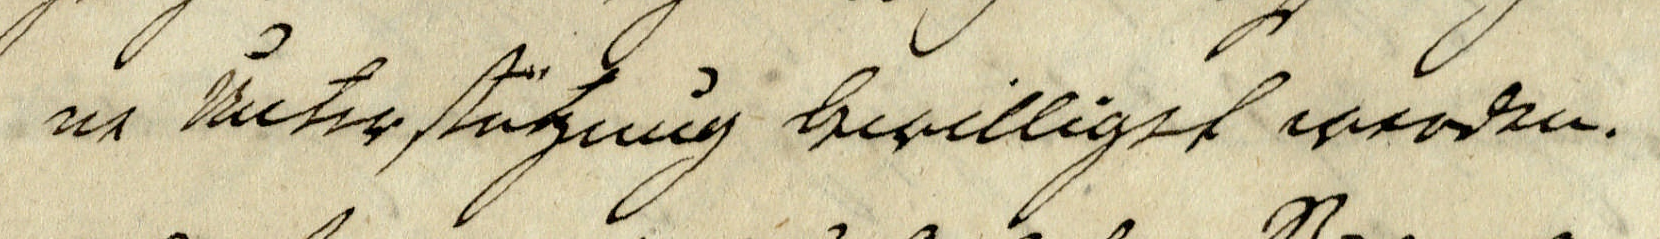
ne Unterstützung bewilliget werden.
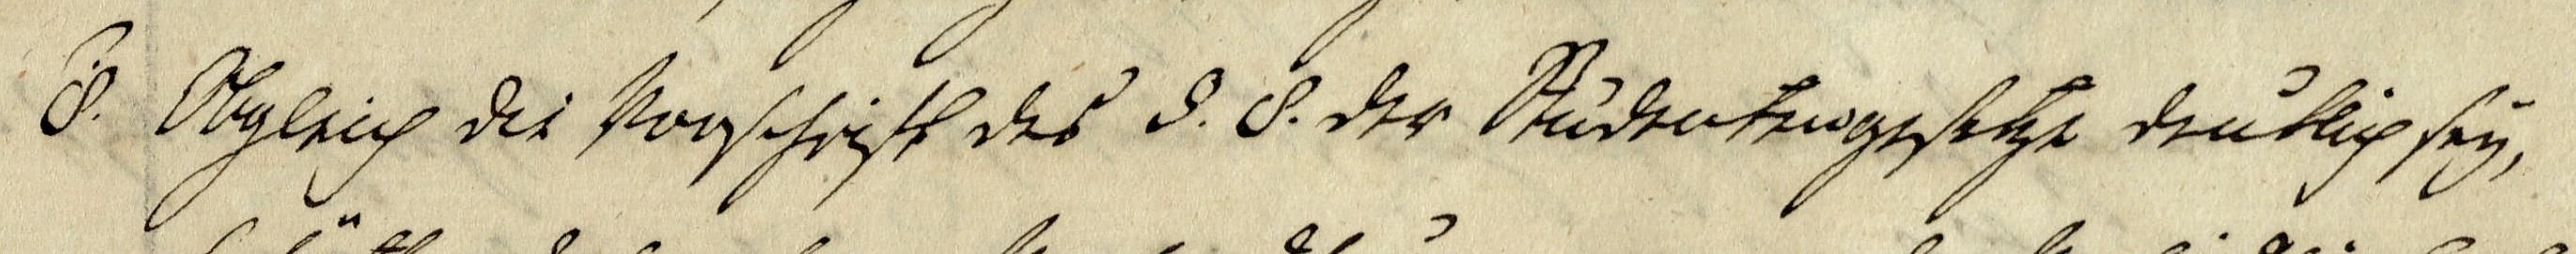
8. Obgleich die Vorschrift des §. 8. der Studentengesetze deutlich seÿ,
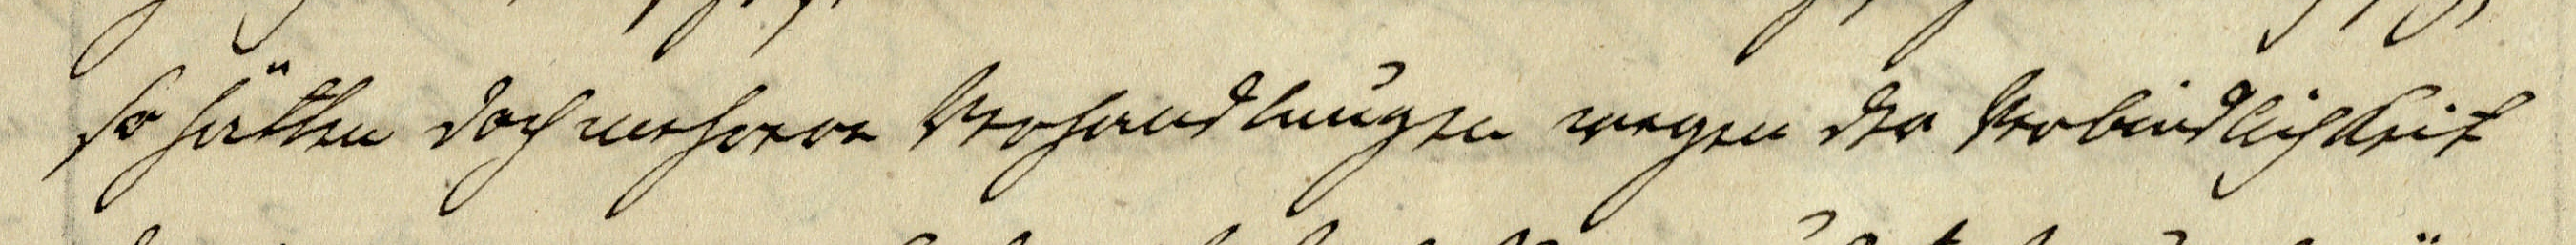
so hätten doch mehrere Verhandlungen wegen der Verbindlichkeit
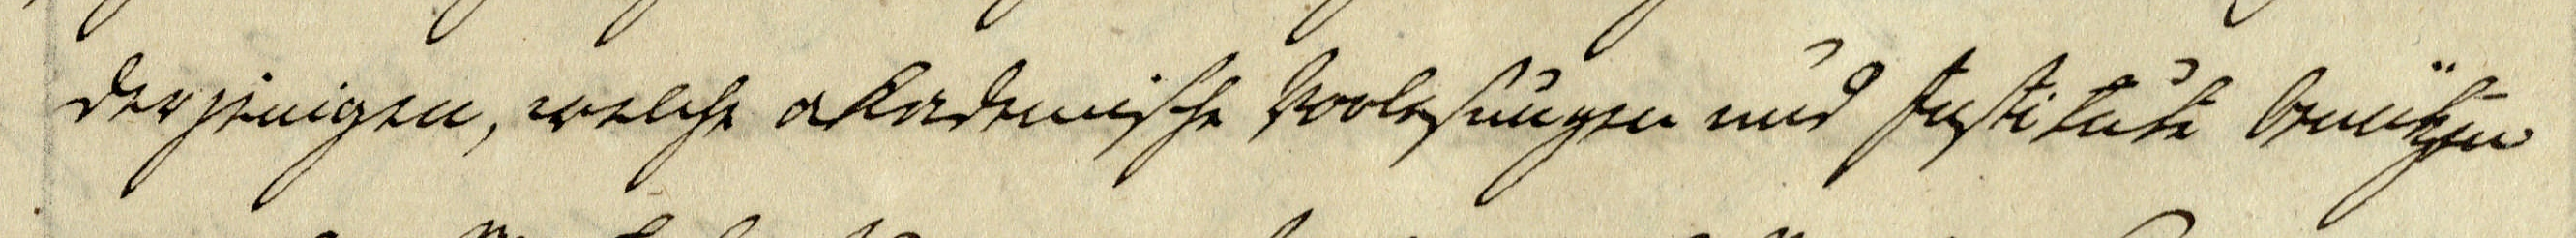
derjenigen, welche akademische Vorlesungen und Institute benützen
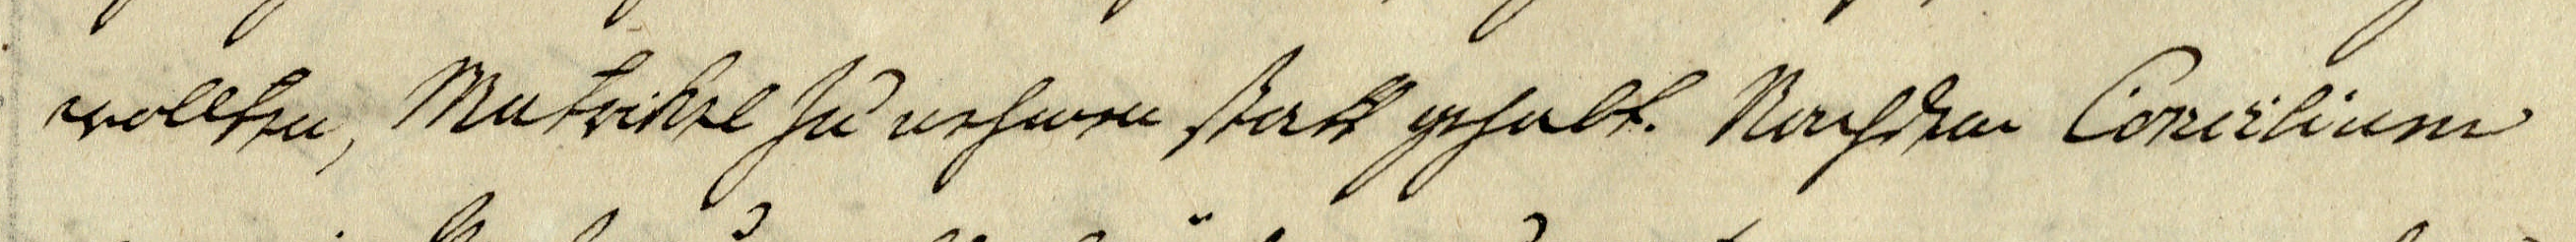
wollten, Matrikel zu nehmen statt gehabt. Nachdem Concilium
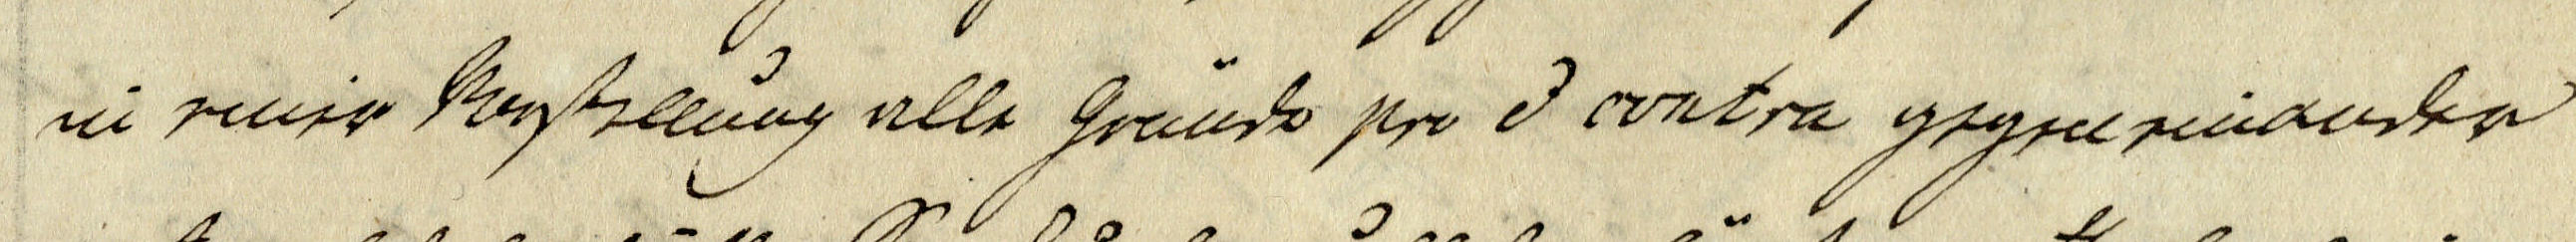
in einer Vorstellung alle Gründe pro et contra gegeneinander
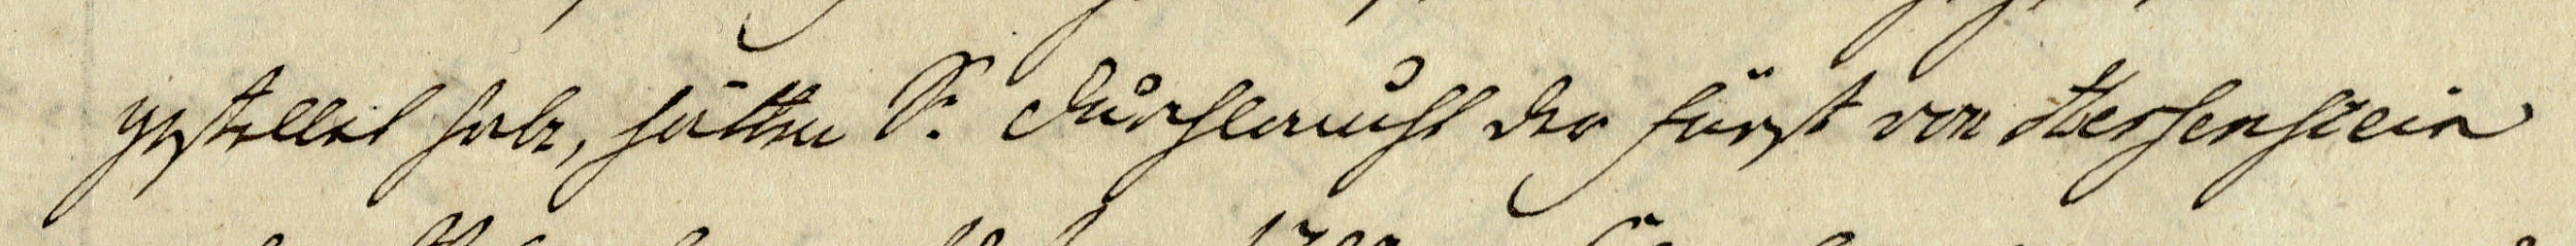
gestellet habe, hätten Sr. Durchlaucht der Fürst von Hessenstein
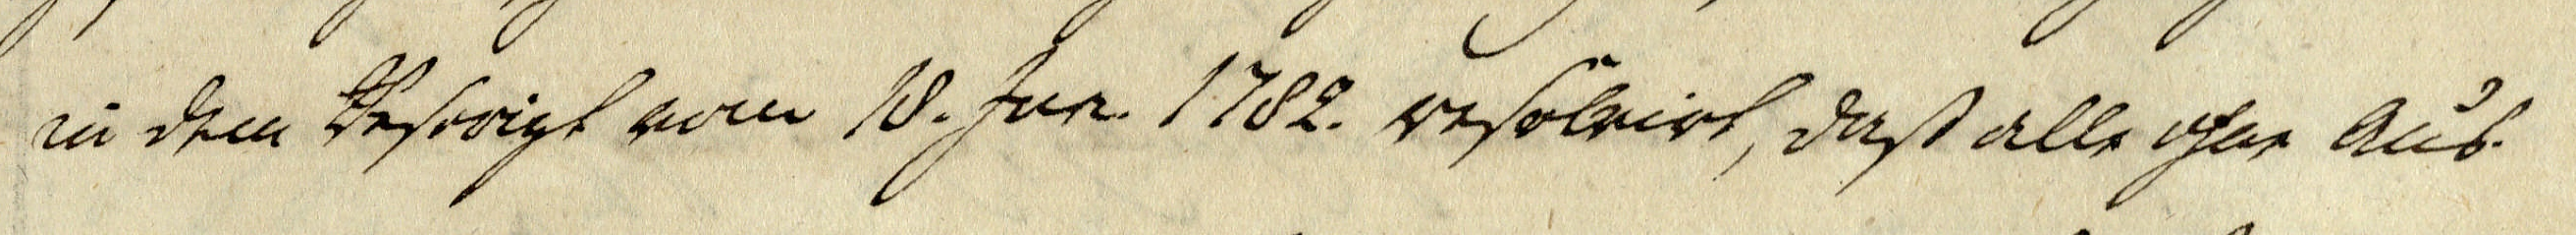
in dem Rescript vom 18. Jun. 1782. resolvirt, daß alle ohne Aus¬
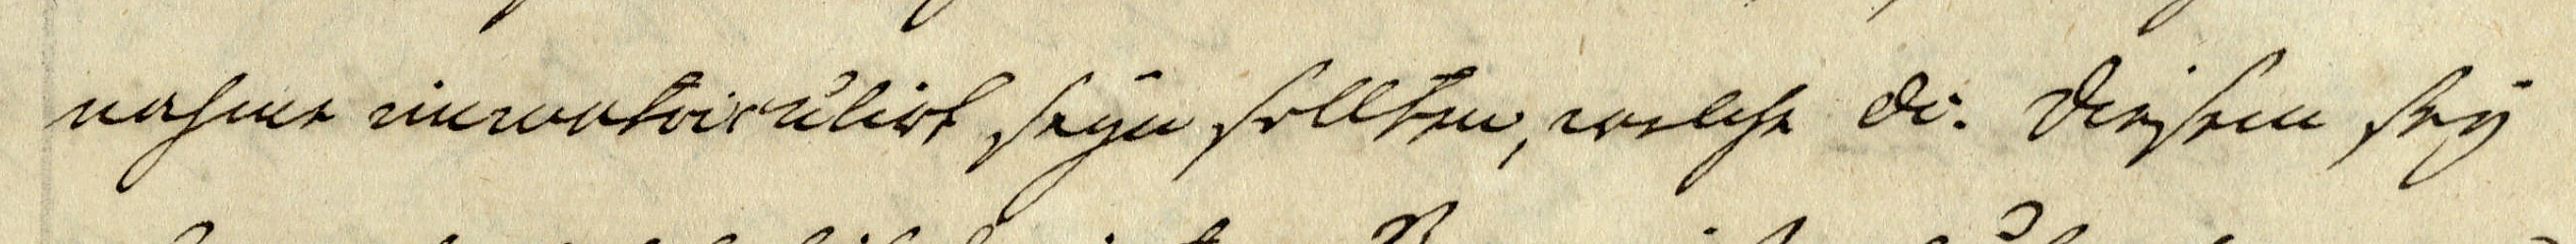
nahme immatriculirt seÿn sollten, welche di. diesem seÿ
